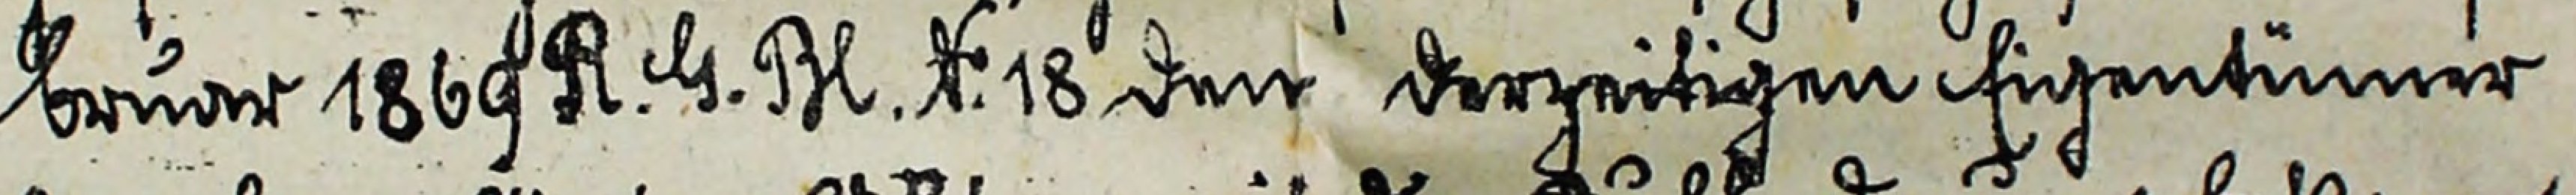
bruar 1869 R. G. Bl. No 18 den derzeitigen Eigentümer
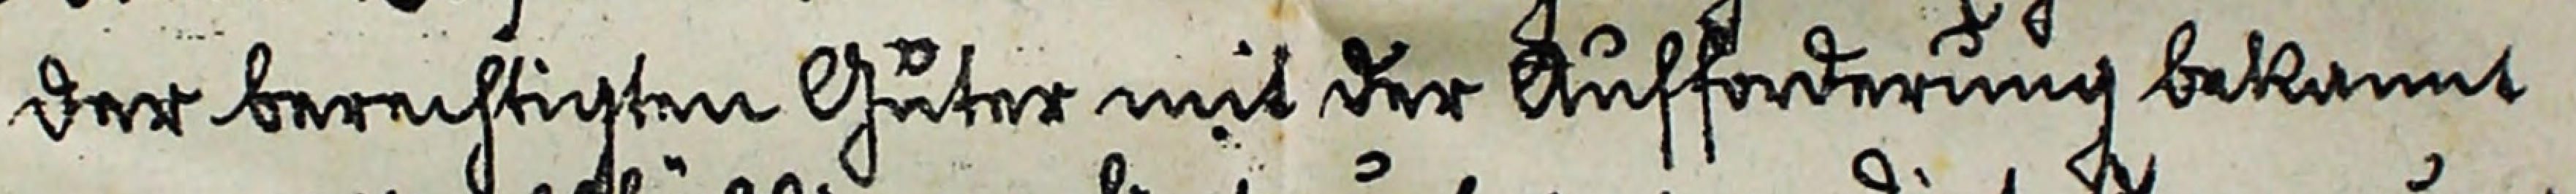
der berechtigten Guter mit der Aufforderung bekannt
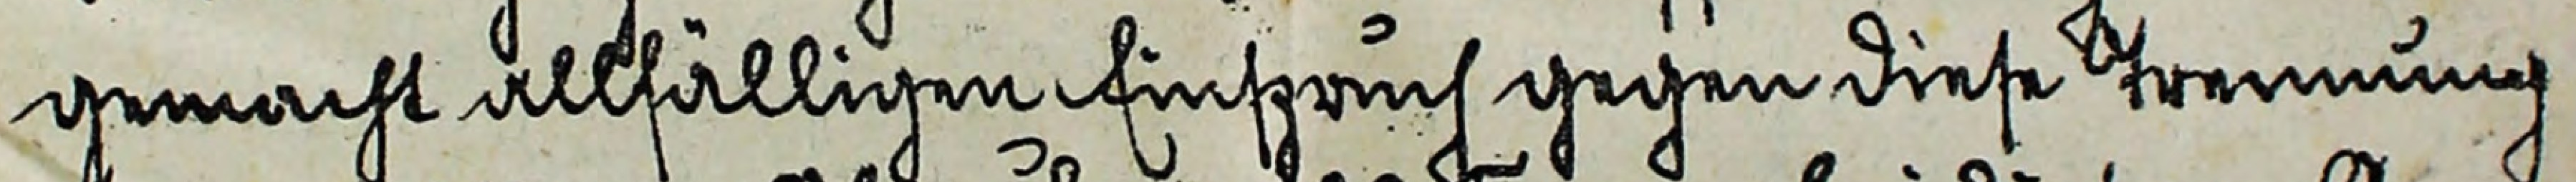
gemacht allfälligen Einspruch gegen diese Trennung
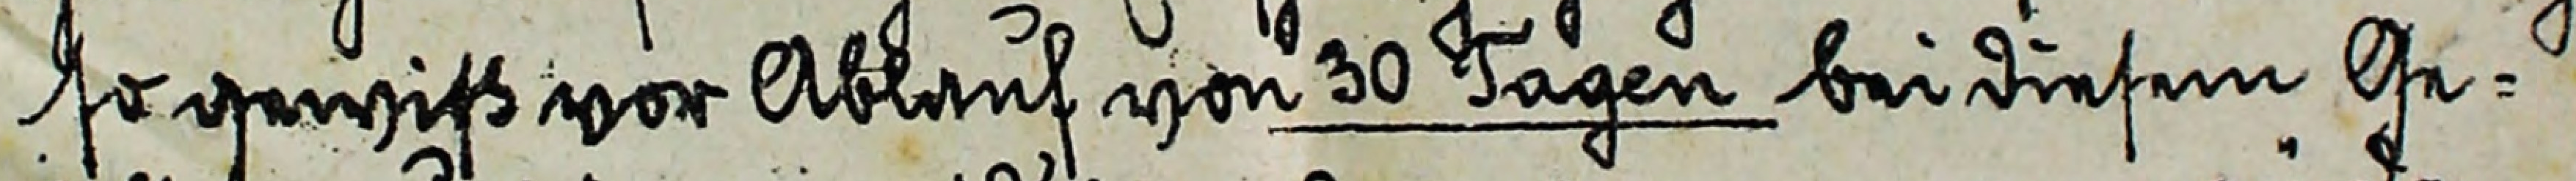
so gewiß vor Ablauf von 30 Tagen bei diesem Ge=
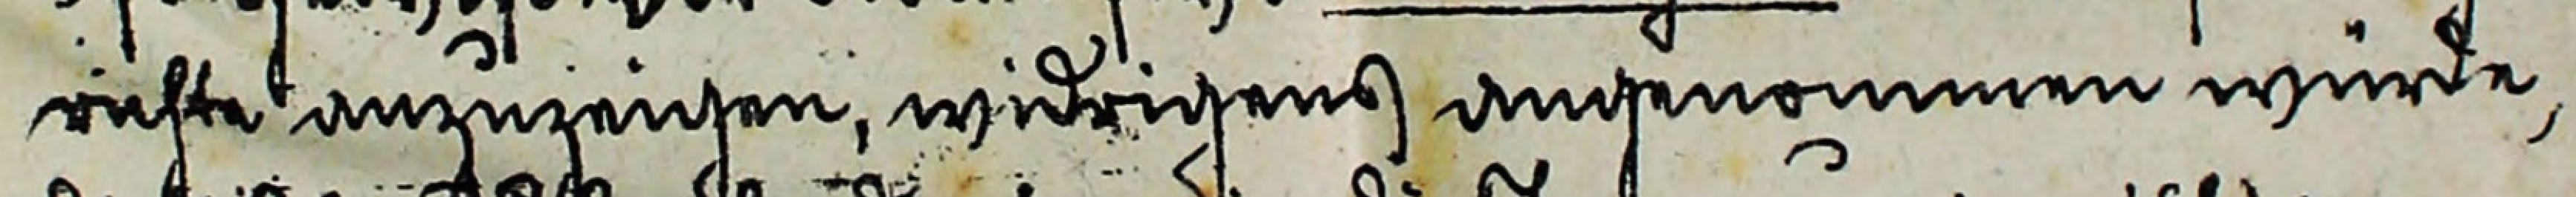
richte anzuzeigen, widrigens angenommen würde,
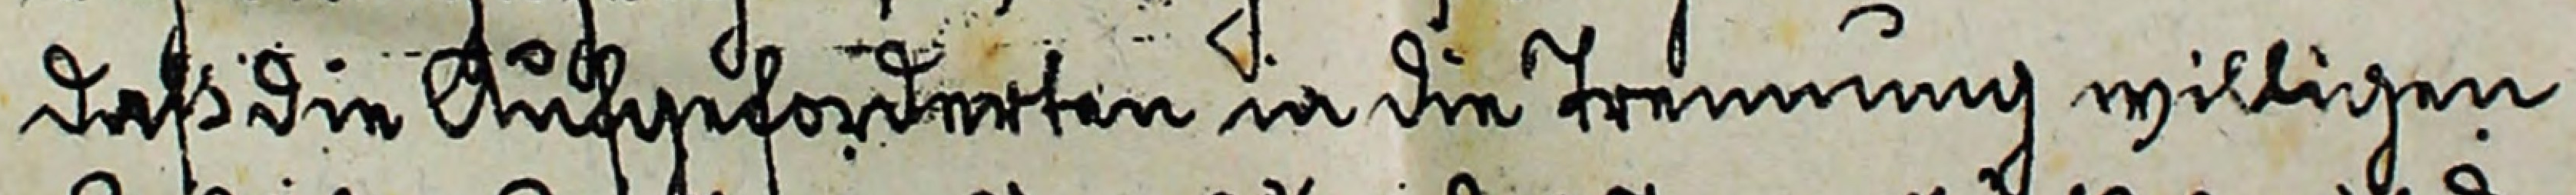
daß die Aufgeforderten in die Trennung willigen
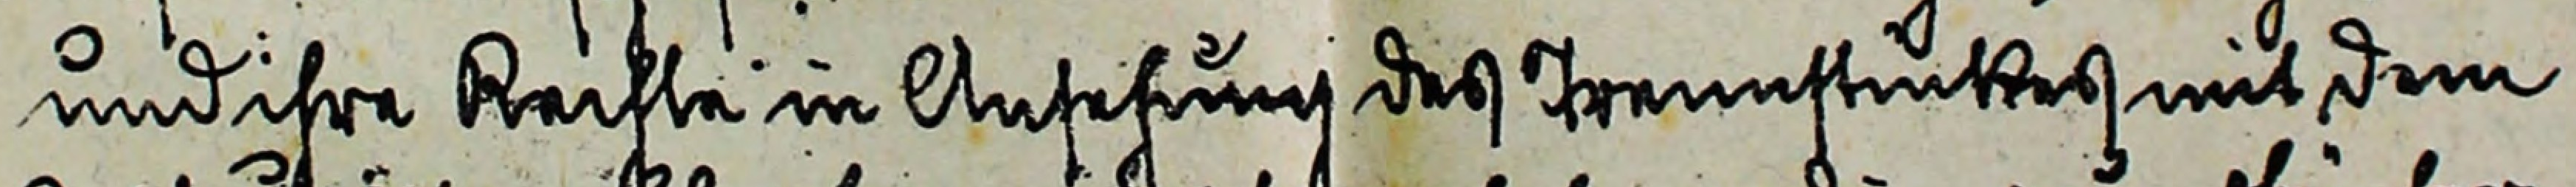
und ihre Rechte in Ansehung des Trennstückes mit dem
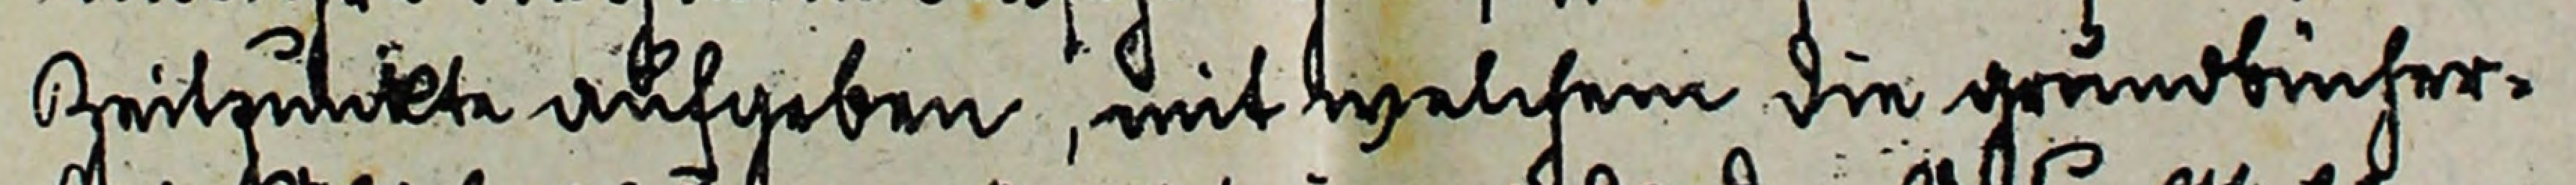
Zeitpunkte aufgeben, mit welchem die grundbücher=
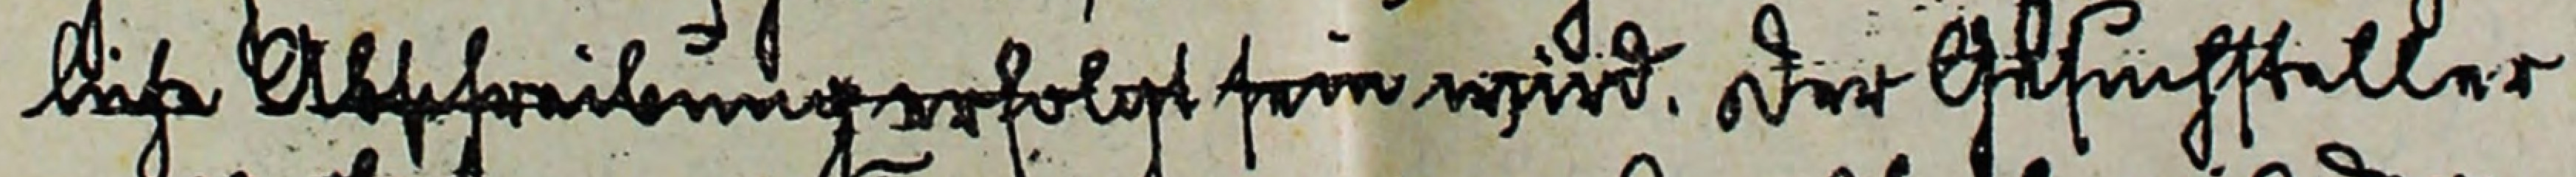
liche Abschreibung erfolgt sein wird. Der Gesuchsteller
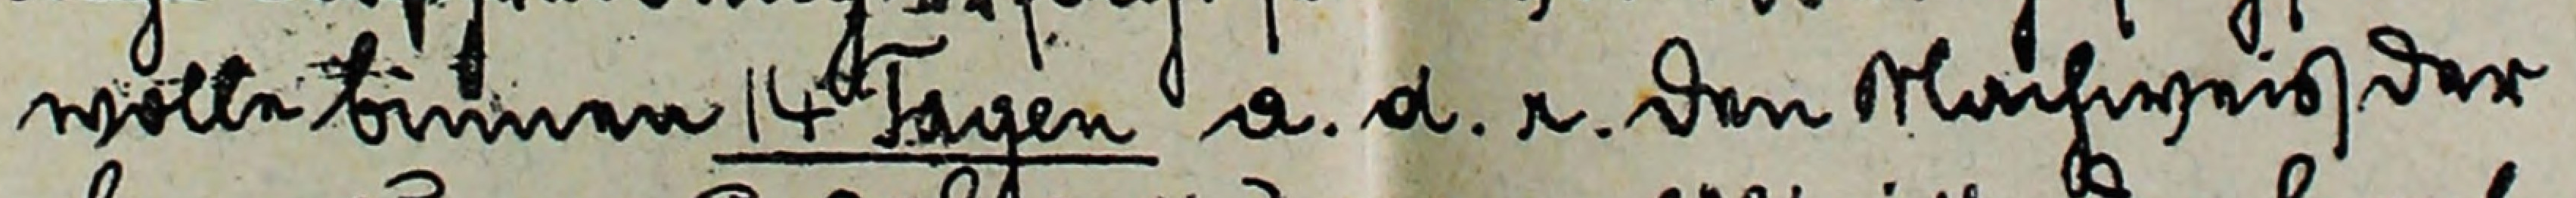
wolle binnen 14 Tagen a.d.c. den Nachweis der
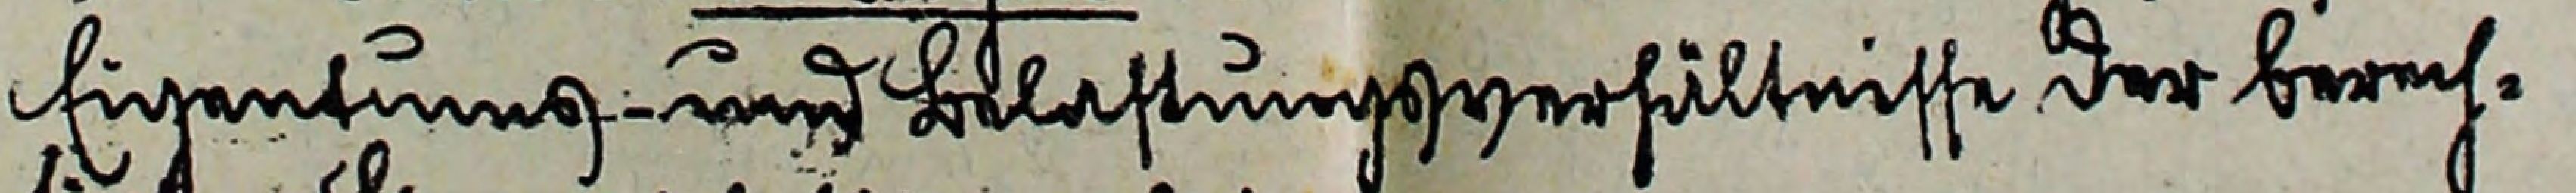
Eigentums- und Belastungsverhältnisse der berech=
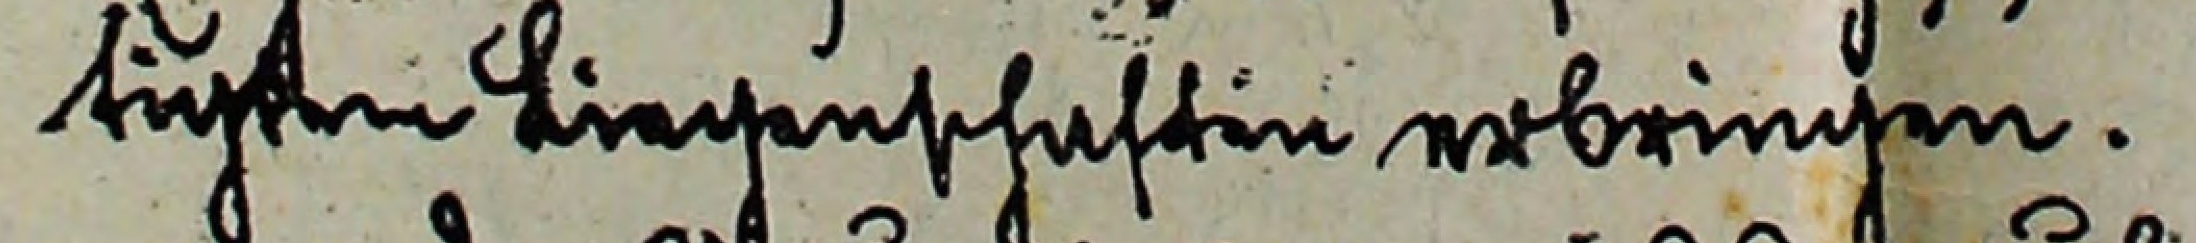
tigten Liegenschaften erbringen.
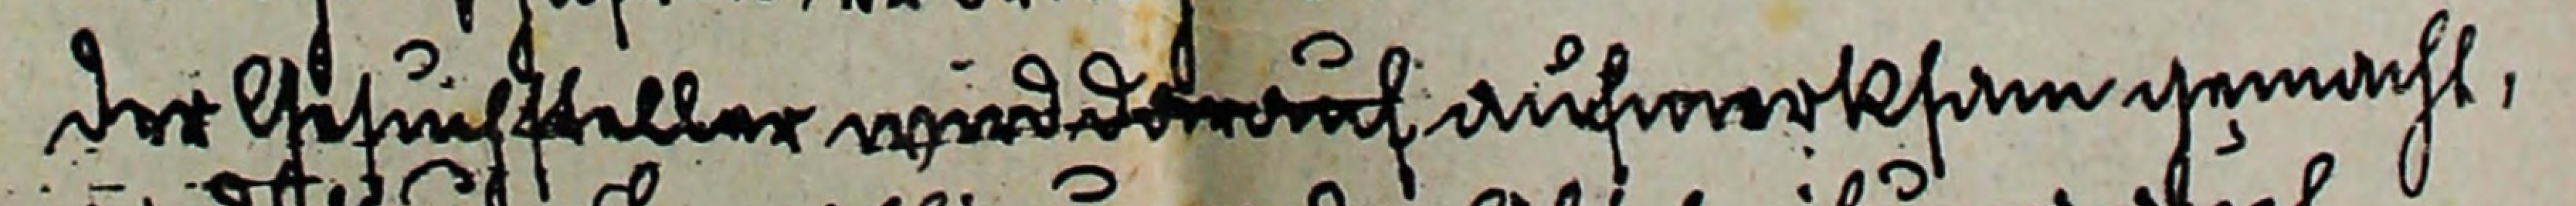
Der Gesuchsteller wird do???uf aufmerksam gemacht,
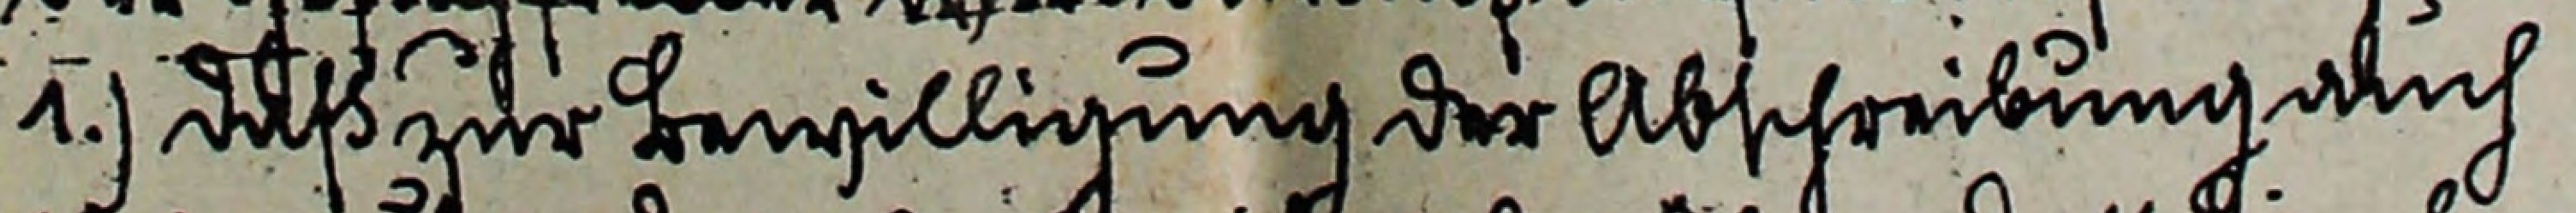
1.) Daß zur Bewilligung der Abschreibung auch
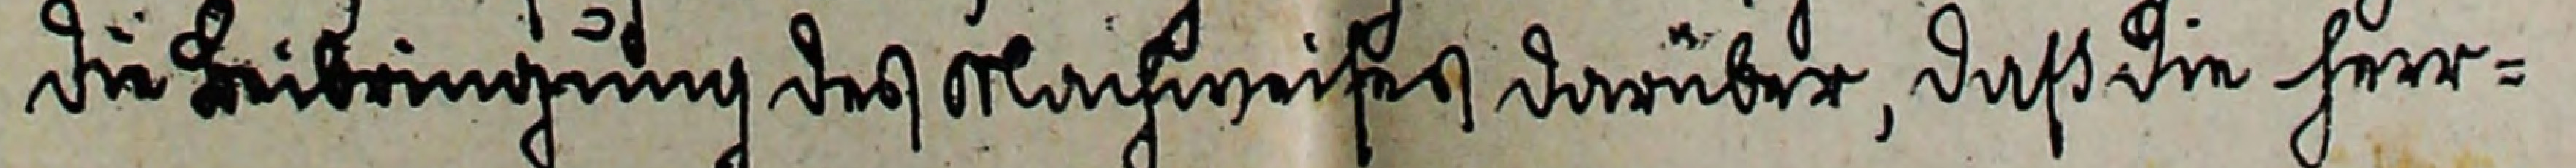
die Beibringung des Nachweises darüber, daß die Herr=
